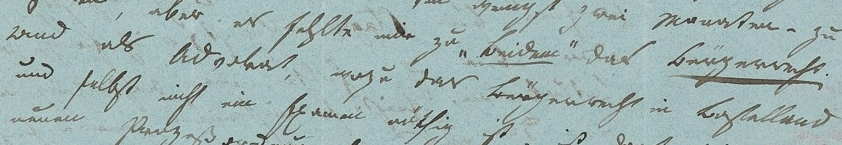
Und als Advokat, wozu das Bürgerrecht in Baselland
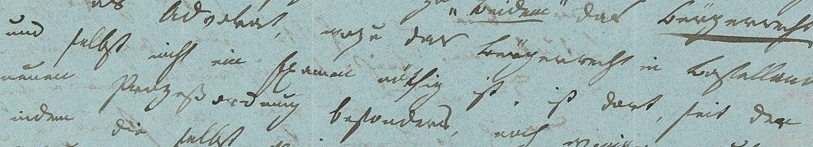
und selbst nicht ein Examen nöthig ist, ist dort, seit der
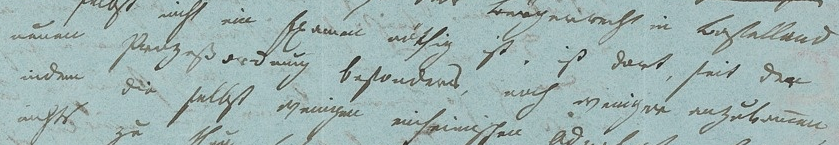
neuen Prozeßordnung besonders, noch weniger anzukommen,
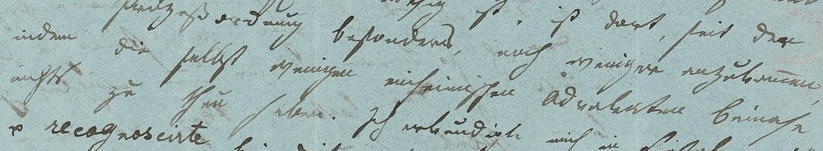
indem die selbst wenigen einheimischen Advokaten beinahe
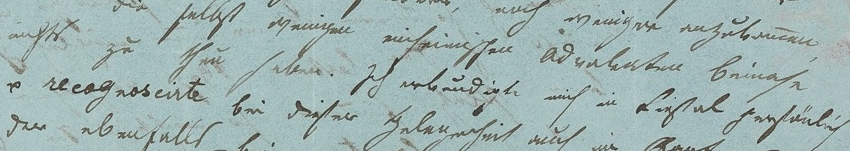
nichts zu thun haben. Ich erkundigte mich in Liestal persönlich
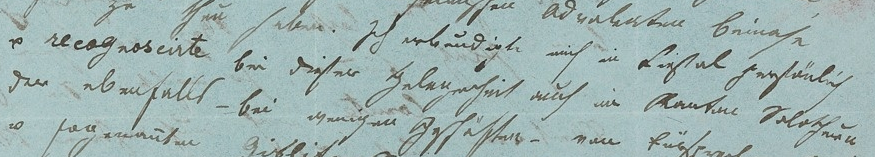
& recognoscirte bei dieser Gelegenheit auch im Kanton Solothurn,
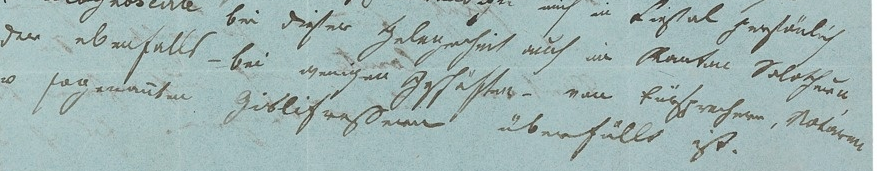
der ebenfalls – bei wenigen Geschäften – von Fürsprechern, Notaren
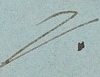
ist.
